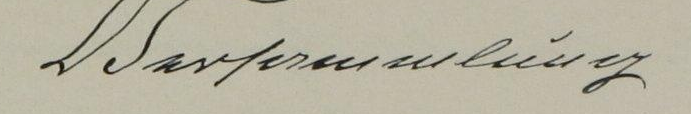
Versammlung
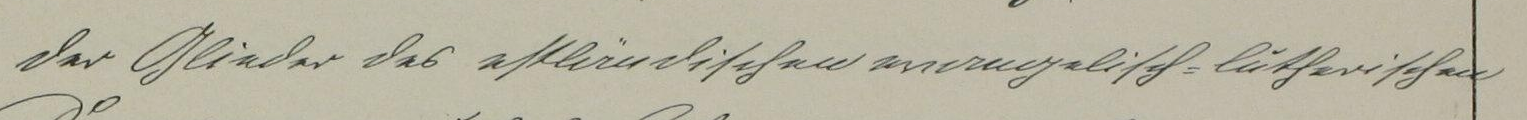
der Glieder des estländischen Evangelisch-lutherischen
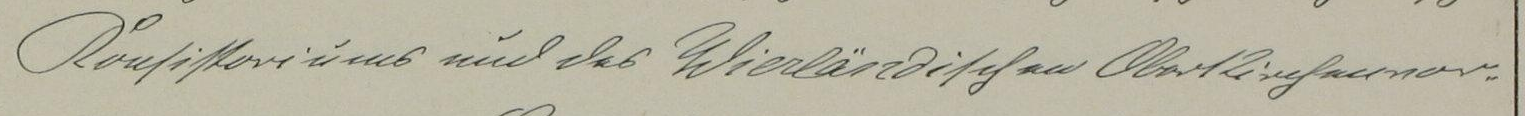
Konsistoriums und des Wierländischen Oberkirchenvor-
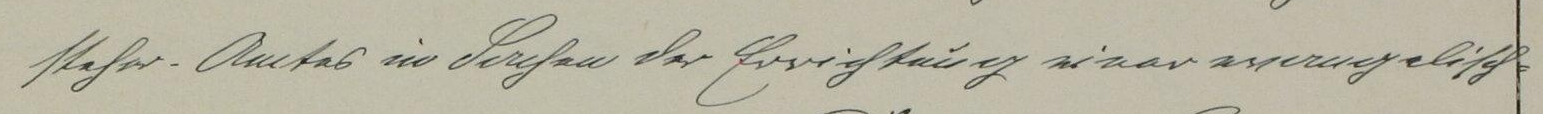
steher-Amtes in Sachen der Errichtung einer evangelisch-
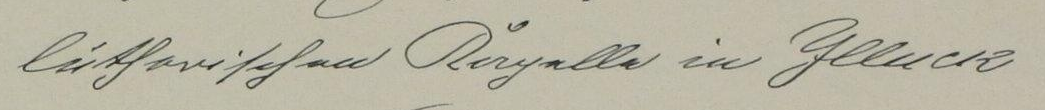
lutherischen Kapelle in Illuck
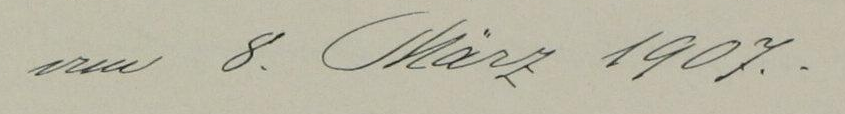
am 8. März 1907.
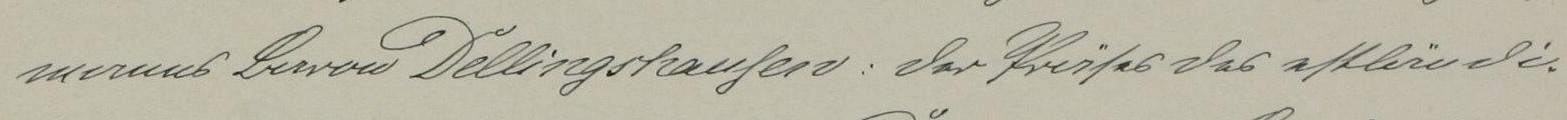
manns Baron Dellingshausen: der Präses des estländi-
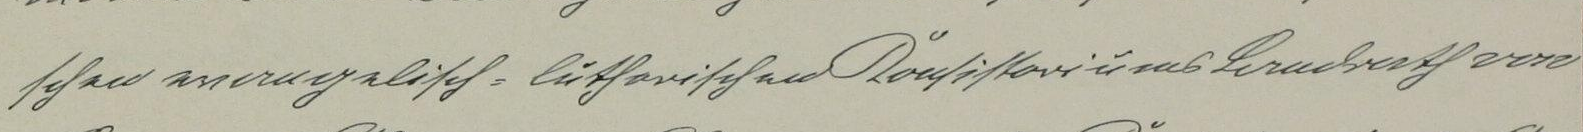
schen evangelisch-lutherischen Konsistoriums Landrath von
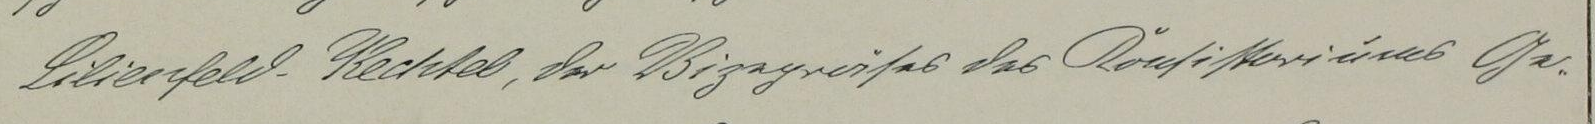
Lilienfeld-Kechtel, der Vizepräses des Konsistoriums Ge-
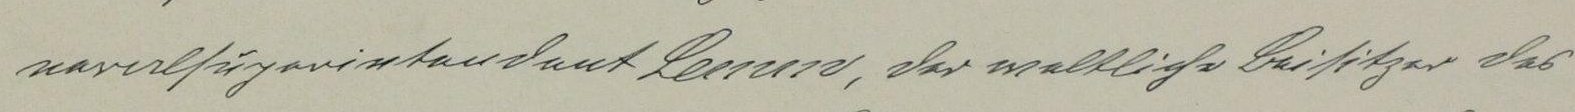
neralsuperintendent Lemm, der weltliche Beisitzer des
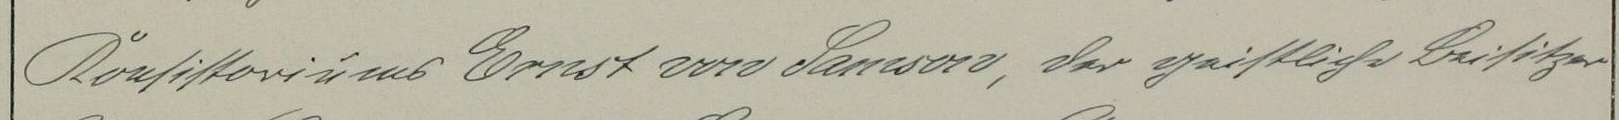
Konsistoriums Ernst von Samson, der geistliche Beisitzer
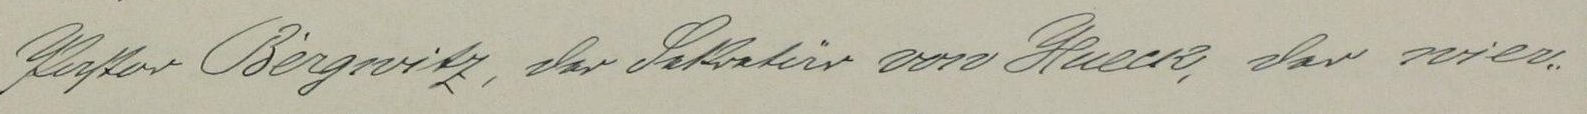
Pastor Bergwitz, der Sekretär von Hueck, der wier-
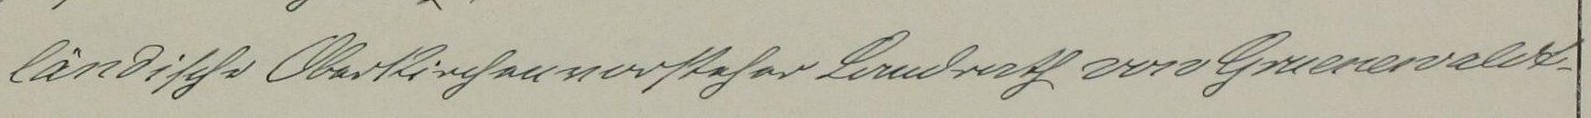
ländische Oberkirchenvorsteher Landrath von Gruenewaldt-
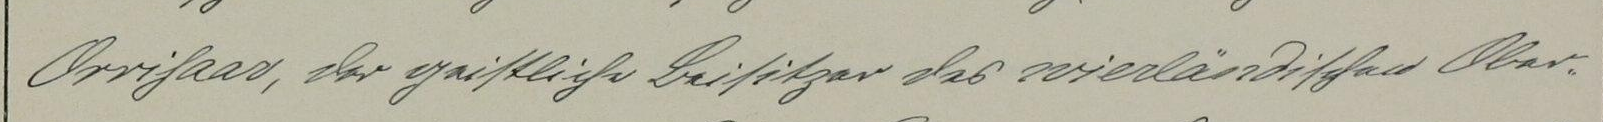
Orrisaar, der geistliche Beisitzer des wierländischen Ober-
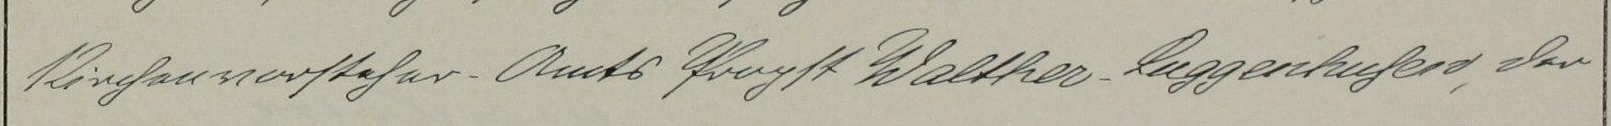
kirchenvorsteher-Amts Propst Walther-Luggenhusen, der
